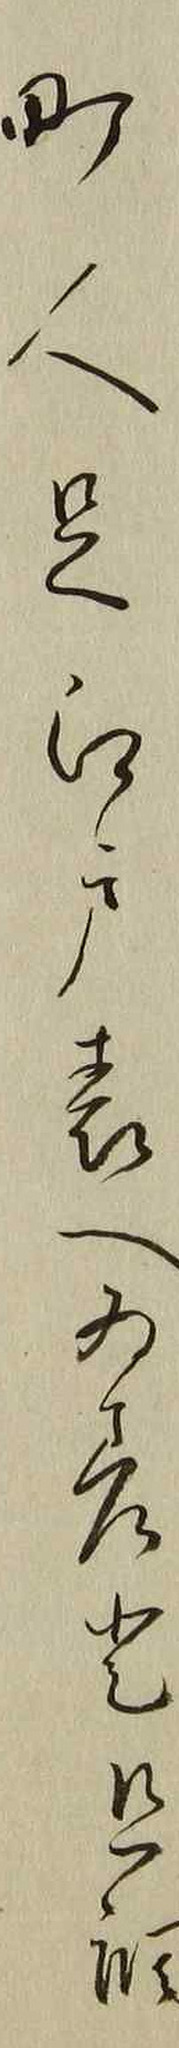町人足江戸表へ為差登且調
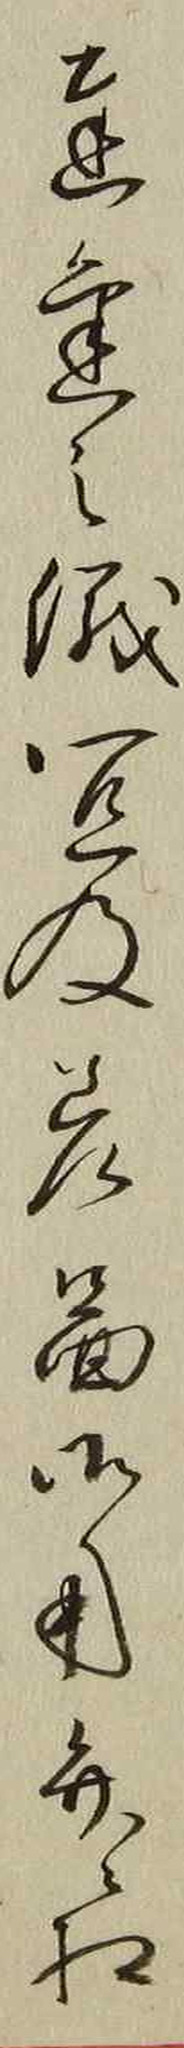達金之儀宜及差図御用弁ニ相
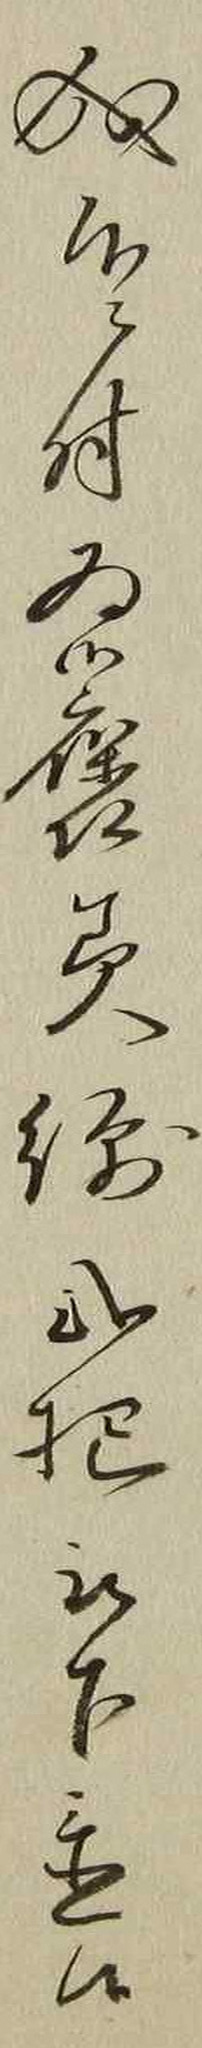成候ニ付為御褒美綿弐把被下置候
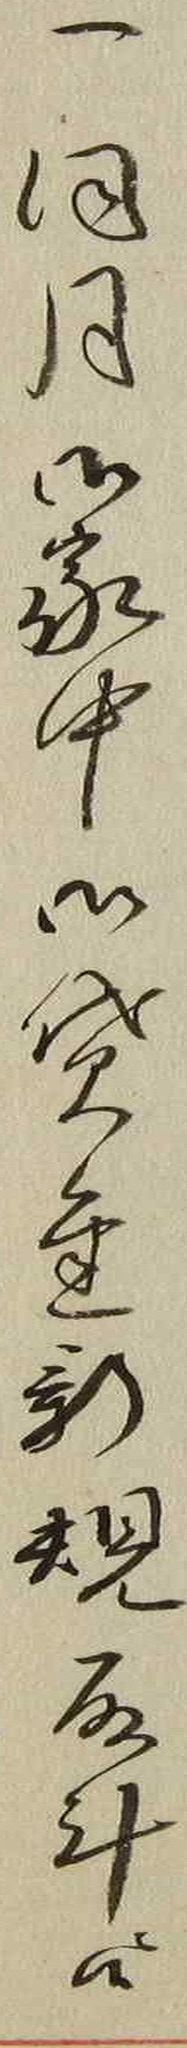一同月御家中御貸金新規取計ニ候
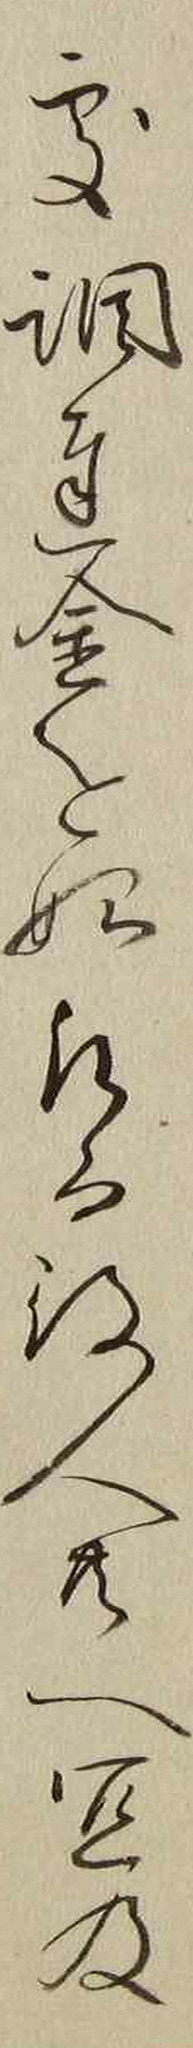処調達金を始凡而役人共へ宜及
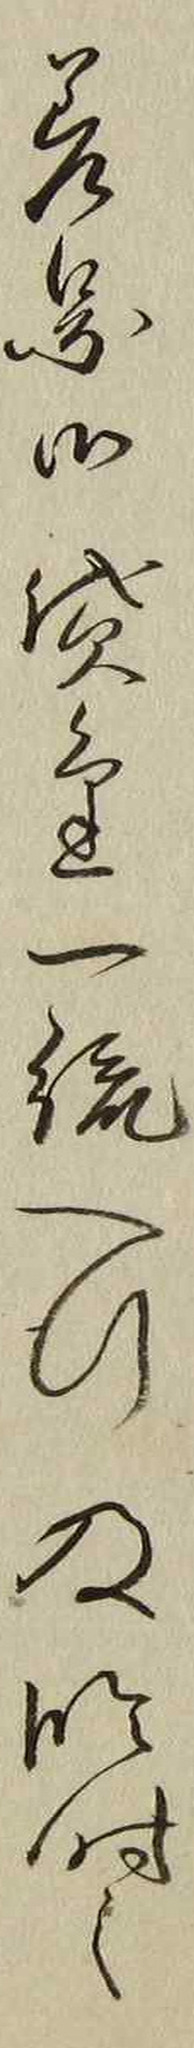差図御貸金一統へ行及臨時之
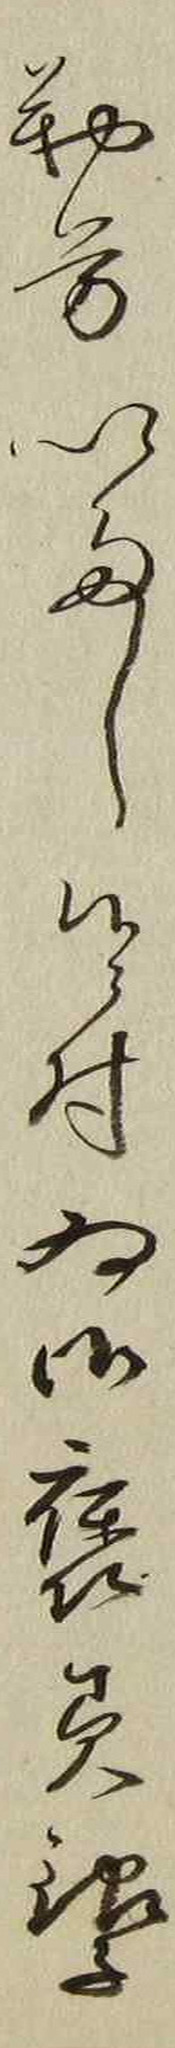勤方いたし候ニ付為御褒美銀子
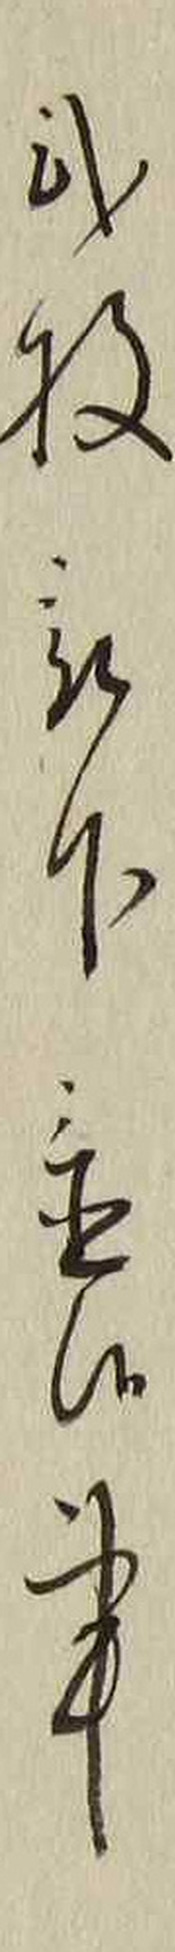弐枚被下置候事
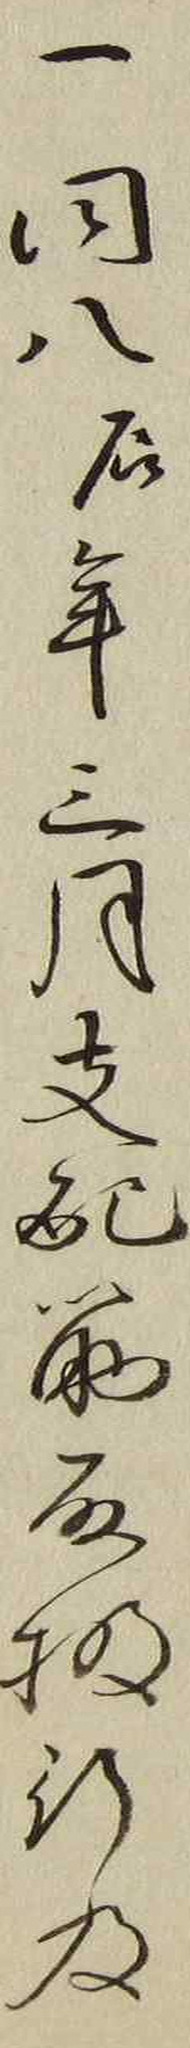一同八辰年三月支配筋取扱行及
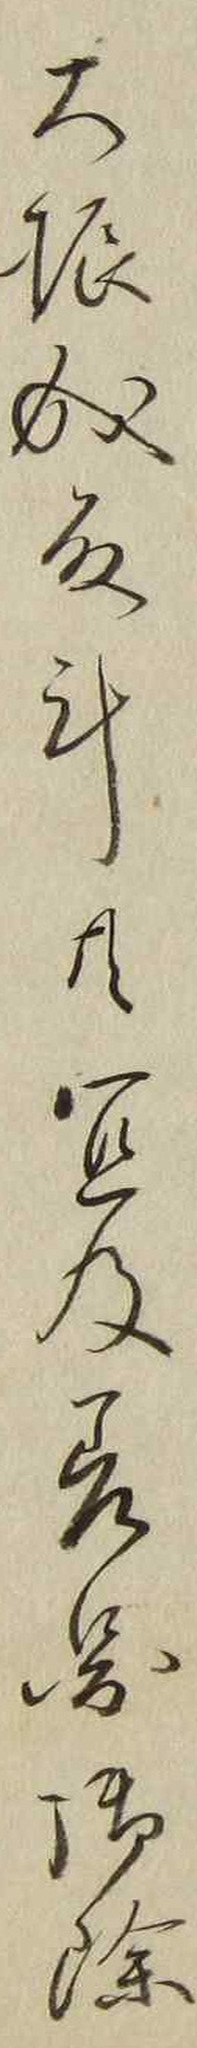大振成取計共宜及差図御除

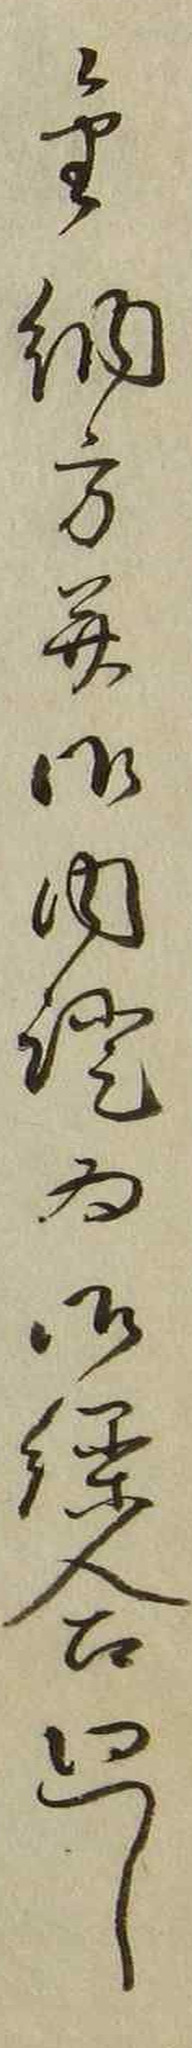金納方幷御内證為御繰合廻し
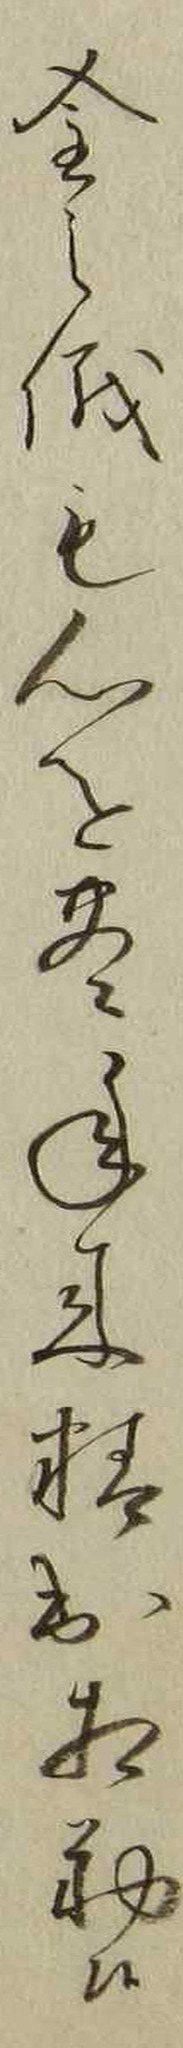金之儀も心を尽年来精出相勤候
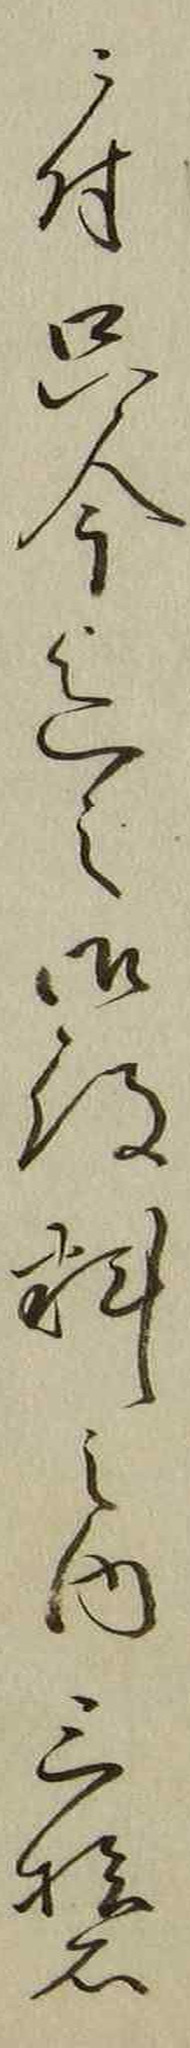に付只今迄の御役料之内三拾石
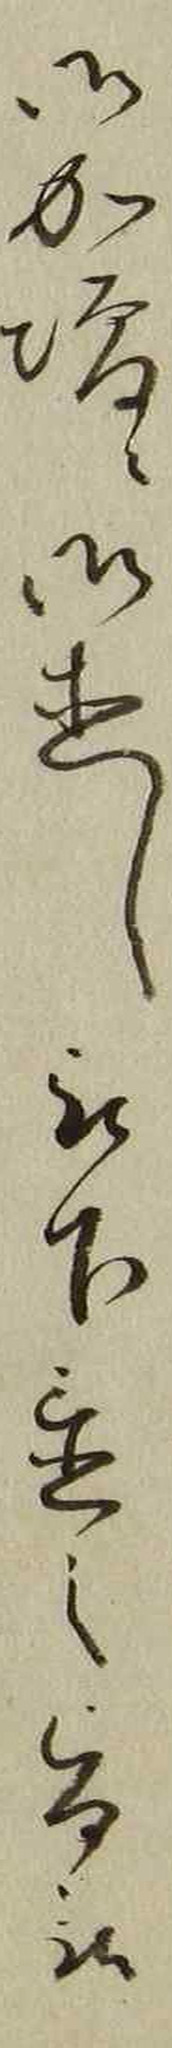御加増に御直し被下置之旨被
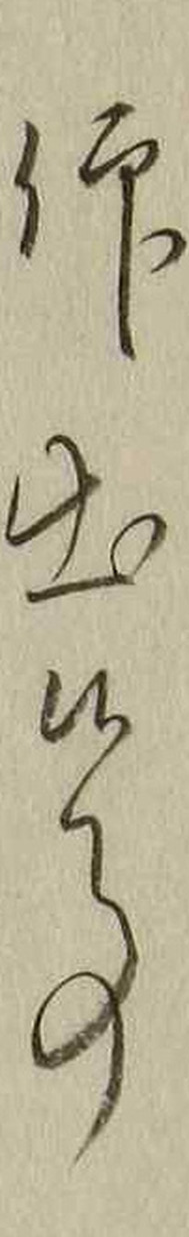仰出候事
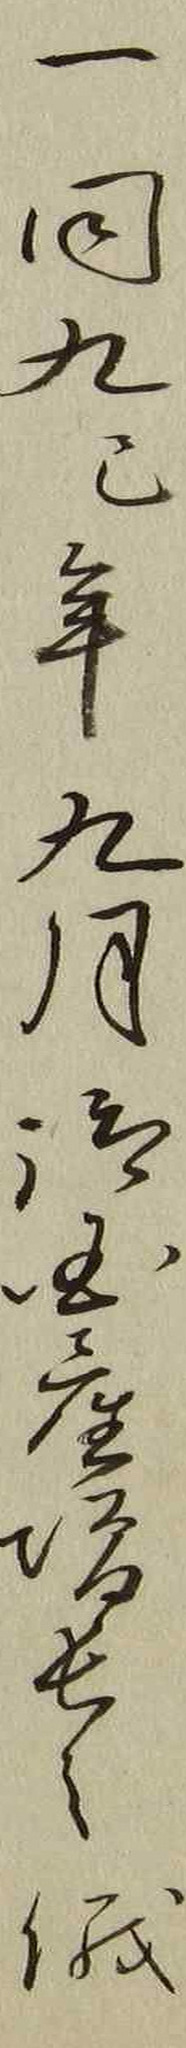一同九巳年九月御国産増長の儀
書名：諸士系譜　巻之3　い之部3
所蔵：会津若松市立会津図書館
